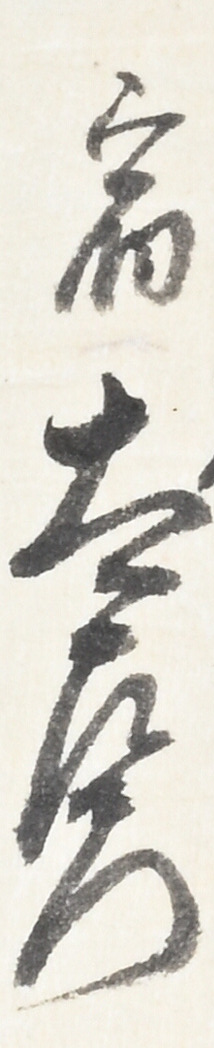宿太左衛門
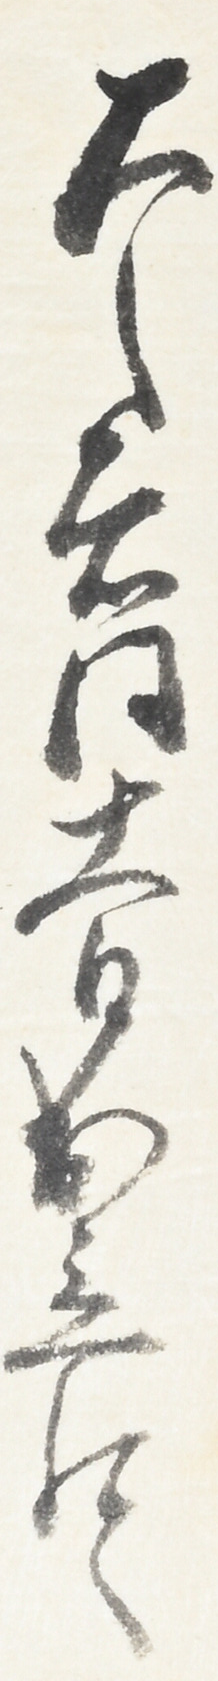右之者同十一日出立仕候
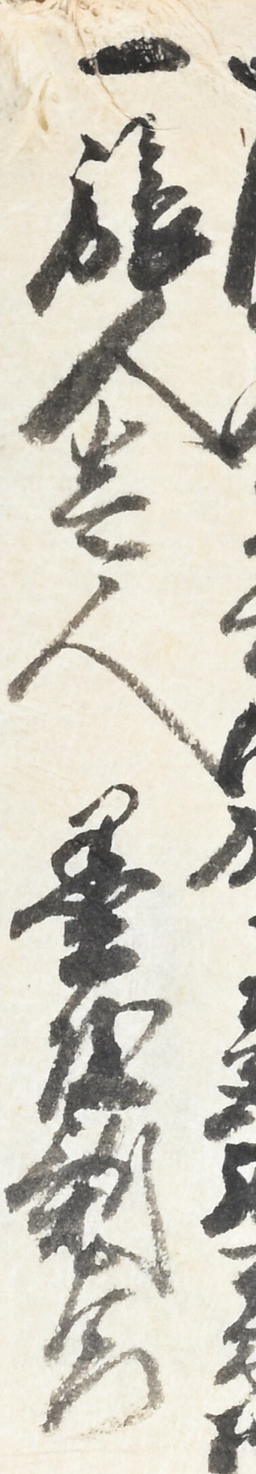一旅人弐人播磨屋八右衛門

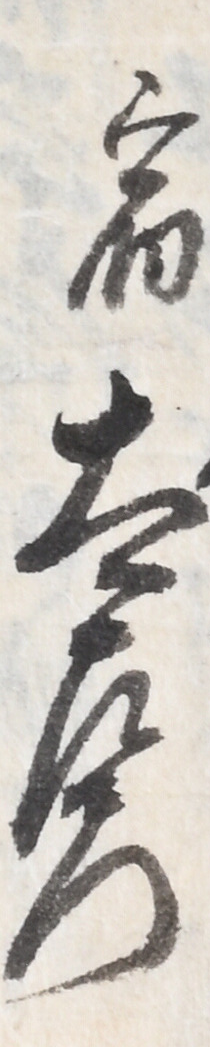宿吉左衛門
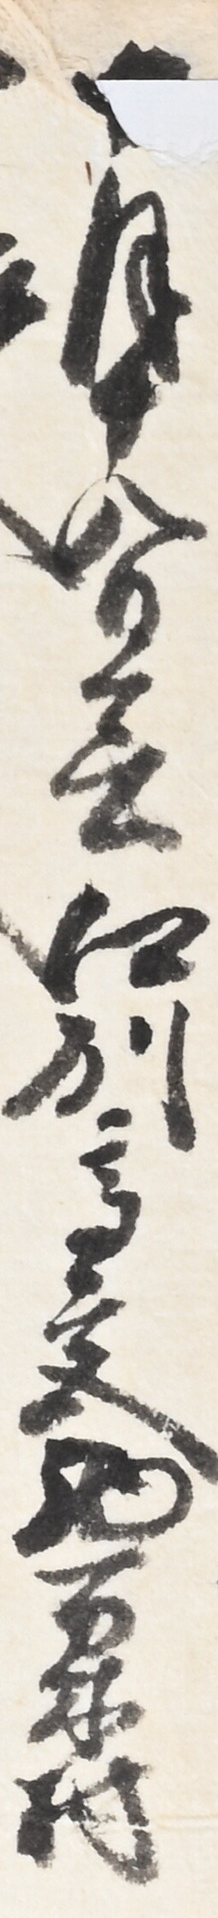十月十八日着江州高宮西万木村
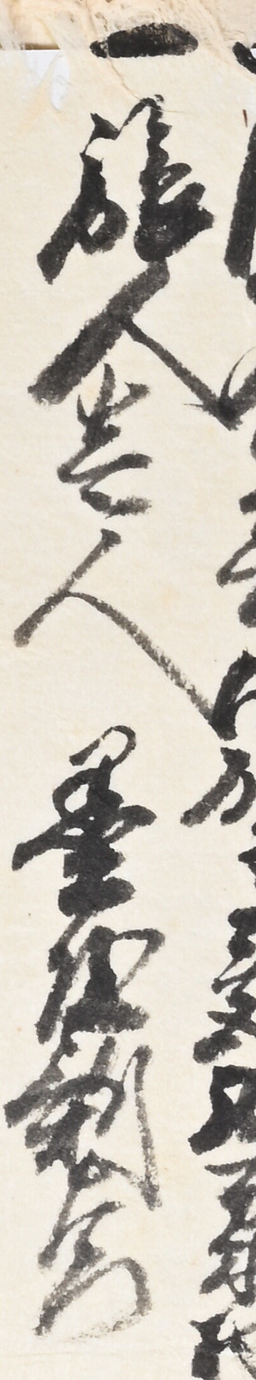一旅人壱人墨屋新右衛門
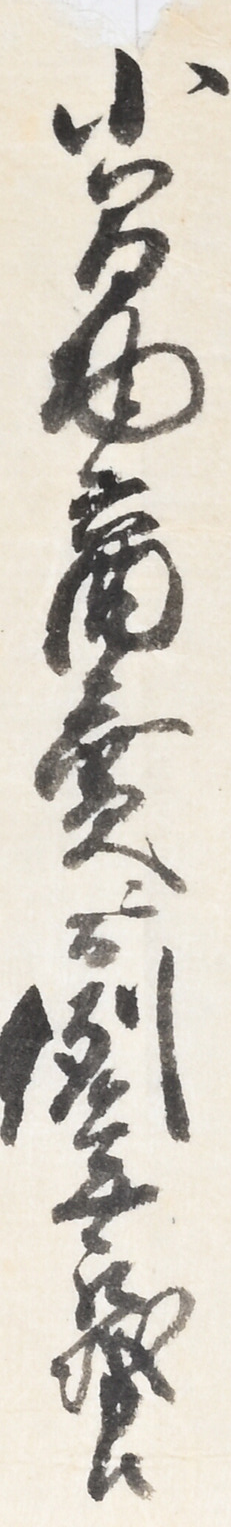小間物商売ニ而例年罷越申候
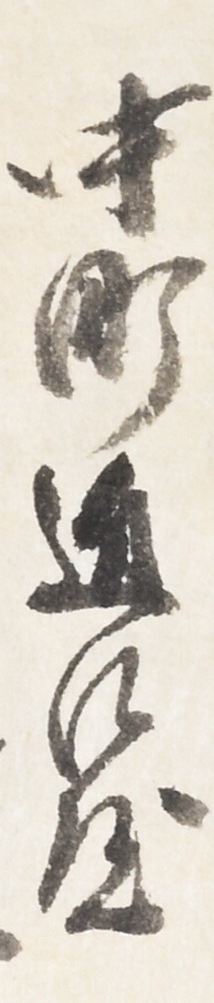中町近江屋
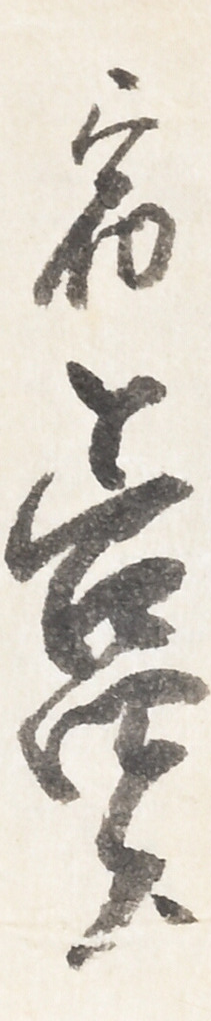宿善四郎
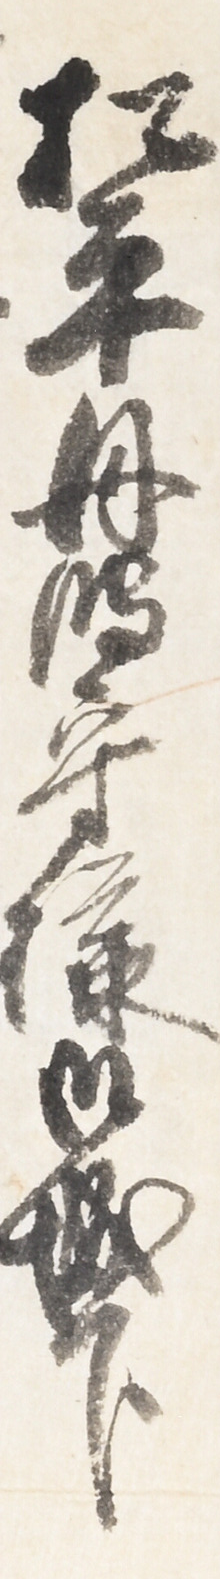松平丹波守様御城下
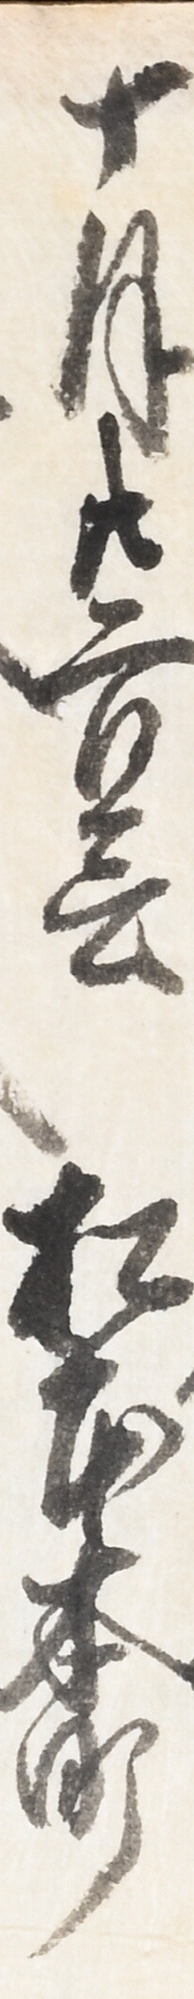十月廿二日着松本本町
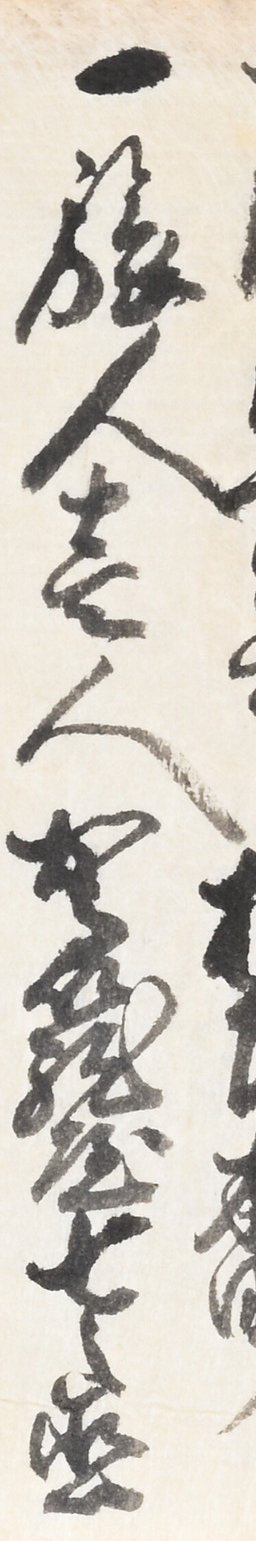一旅人壱人駕籠屋七之丞
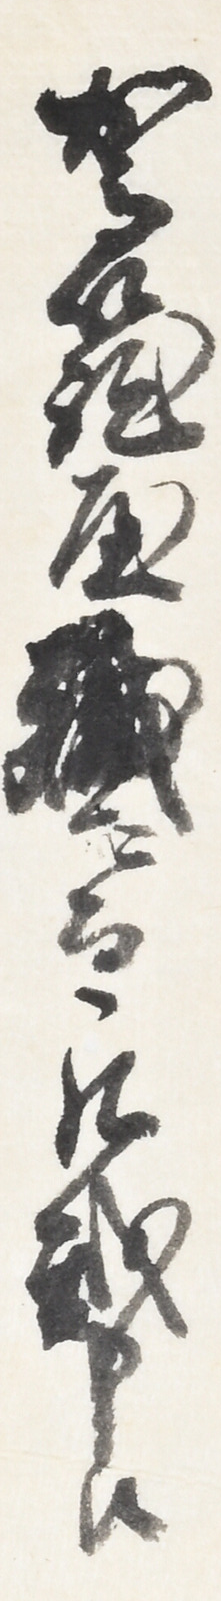駕籠屋職ニ而罷越申候
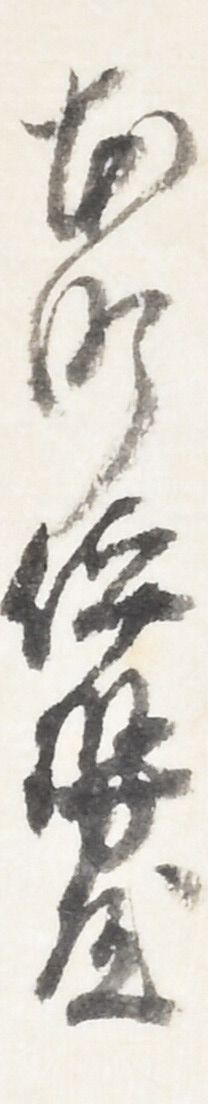本町伊勢屋
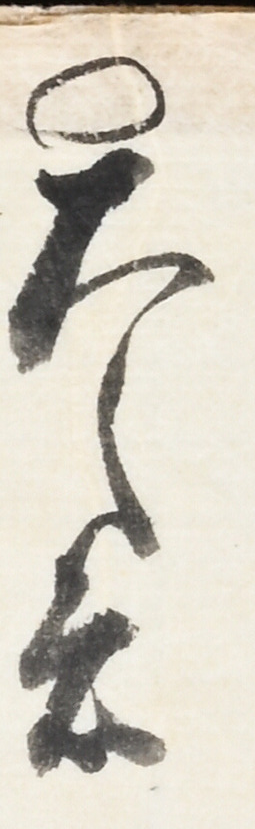〇右之者
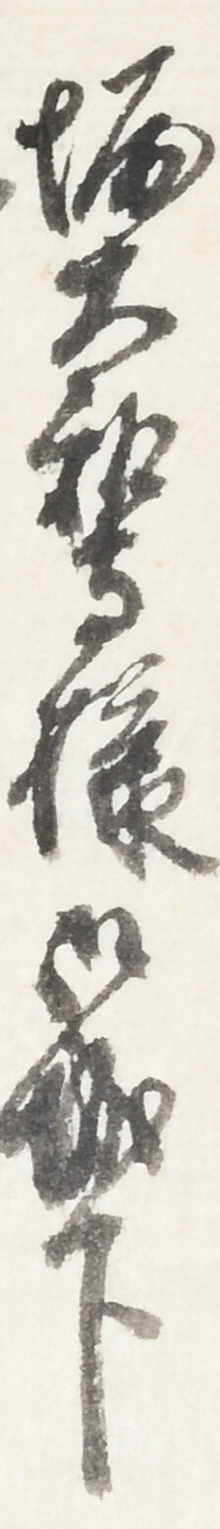堀大和守様御城下
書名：旅人泊控帳
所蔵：伊那市立高遠町図書館・合同会社AMANE
